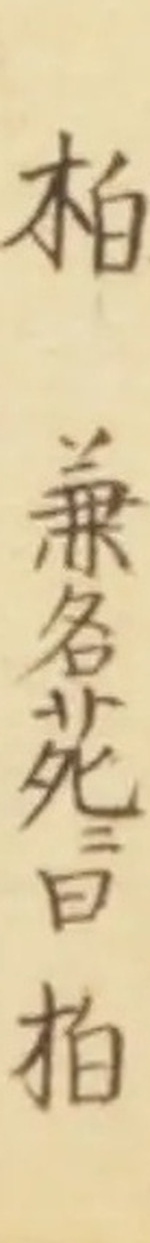柏兼名苑曰柏
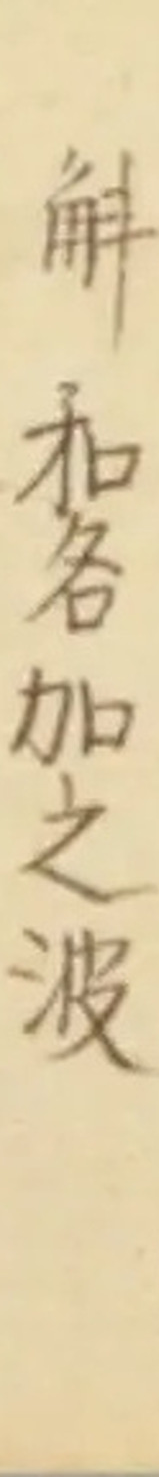斛和名加之波
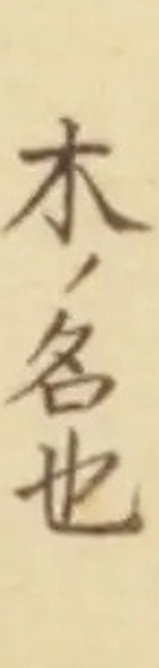木ノ名也
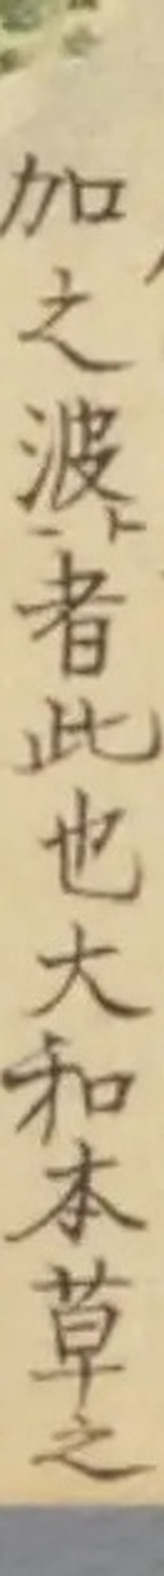加之波者此也大和本草之
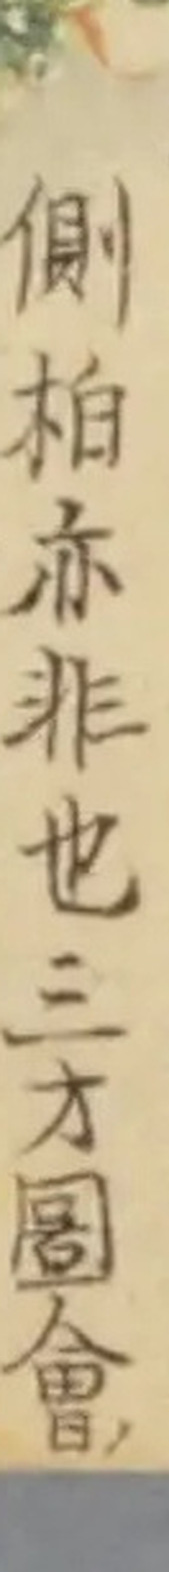側柏亦非也三才図会
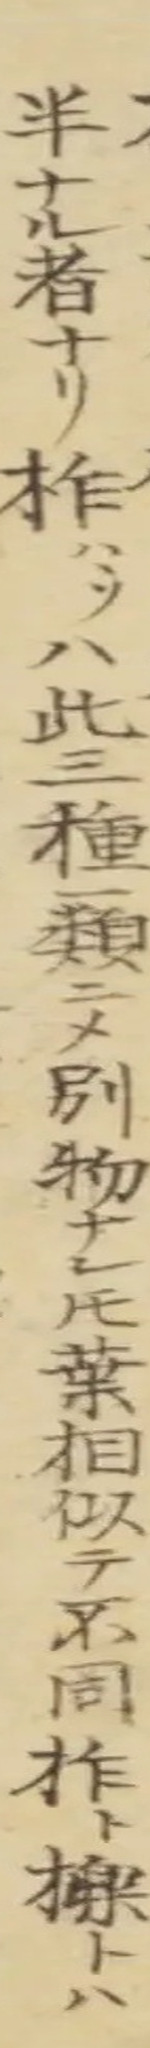半ナル者ナリ柞ハヽソハ此三種一類ニシテ別物ナレトモ葉相似テ不同柞ト檪トハ

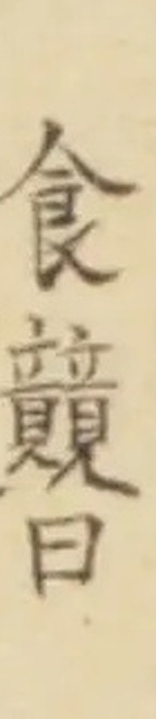食競曰
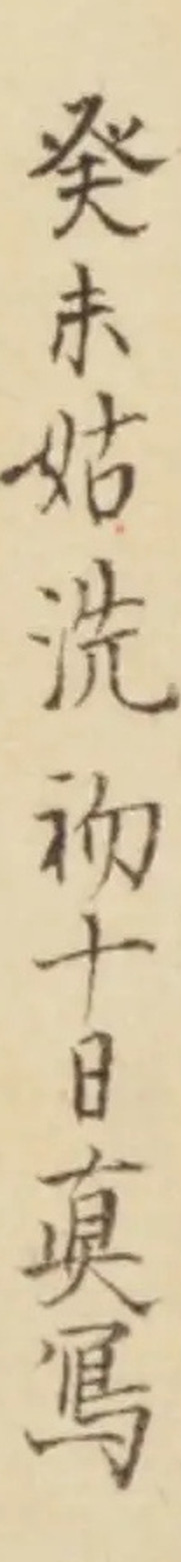癸未姑洗初十日真写
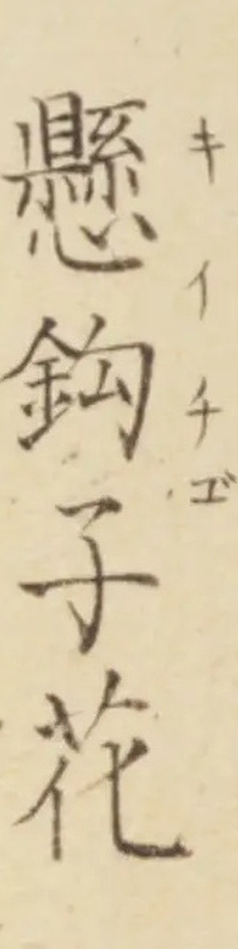懸鈎子花
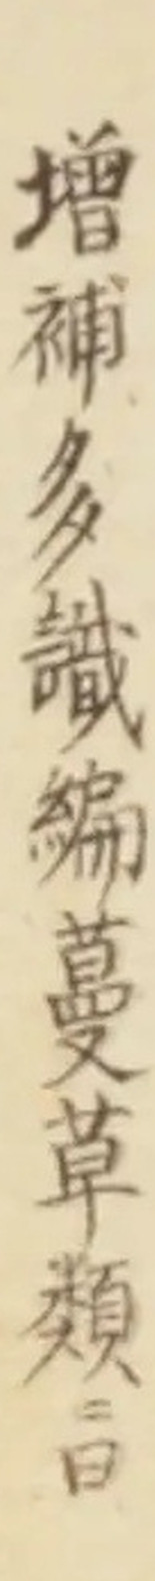増補多識編蔓草類曰

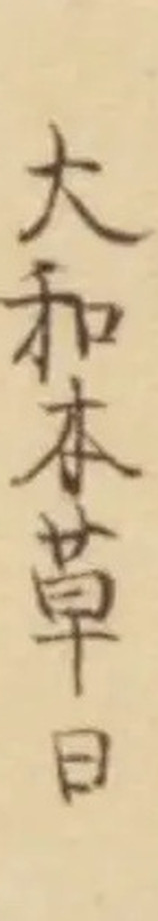大和本草曰
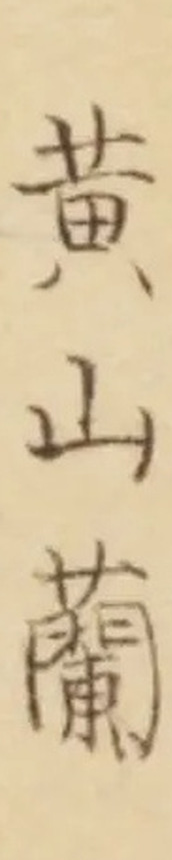黄山蘭
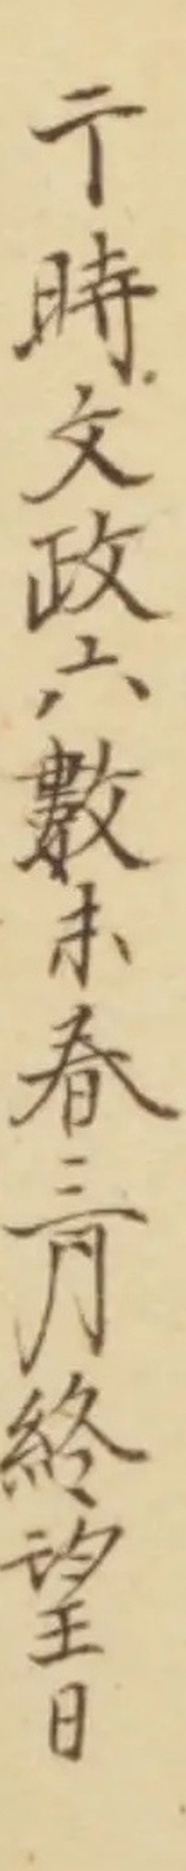于時文政六数？未春三月終望日
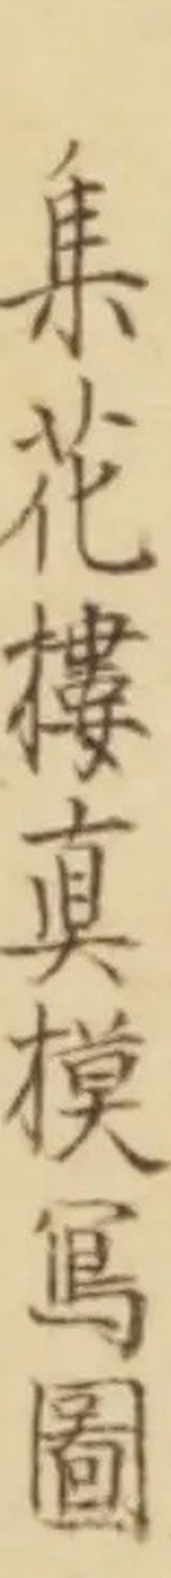集花楼閣直模写図

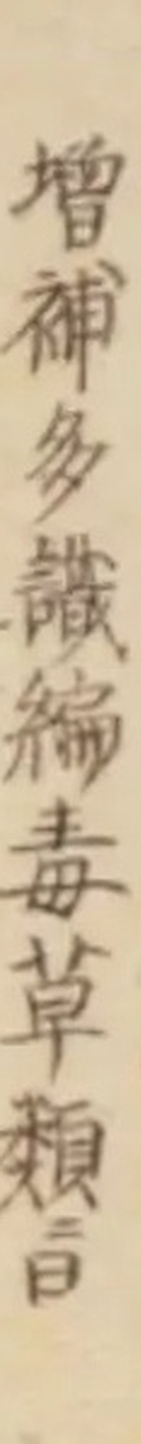増補多識編毒草類曰
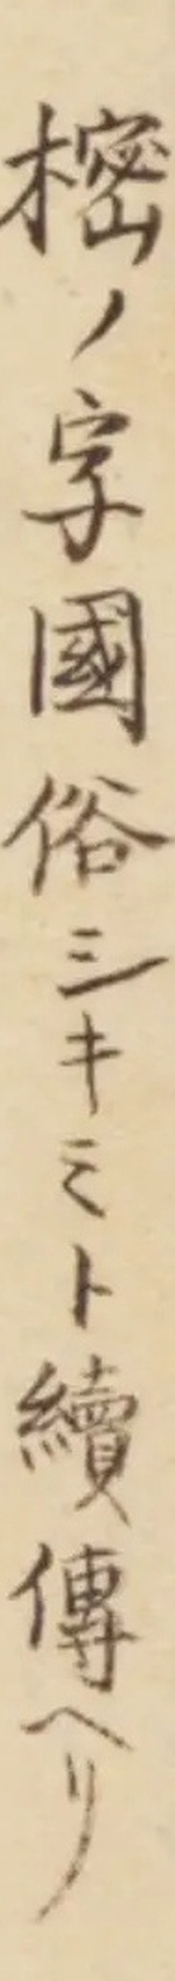樒ノ字国俗シキミト続伝へり
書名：梅園草木花譜春之部. 1
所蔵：国立国会図書館 National Diet Library, JAPAN
